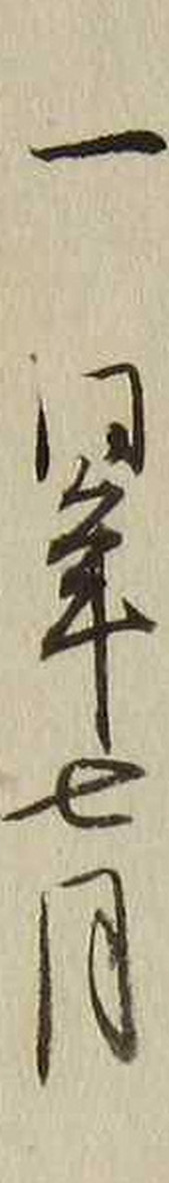一同年七月
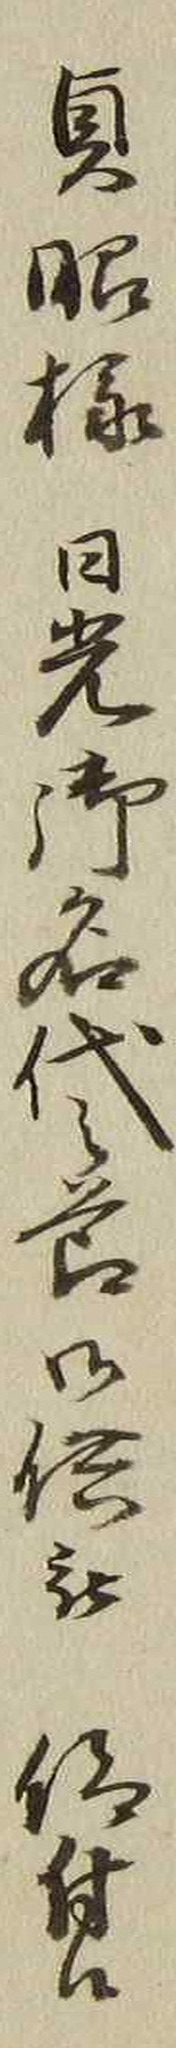貞昭様日光御名代之節御供被仰付候
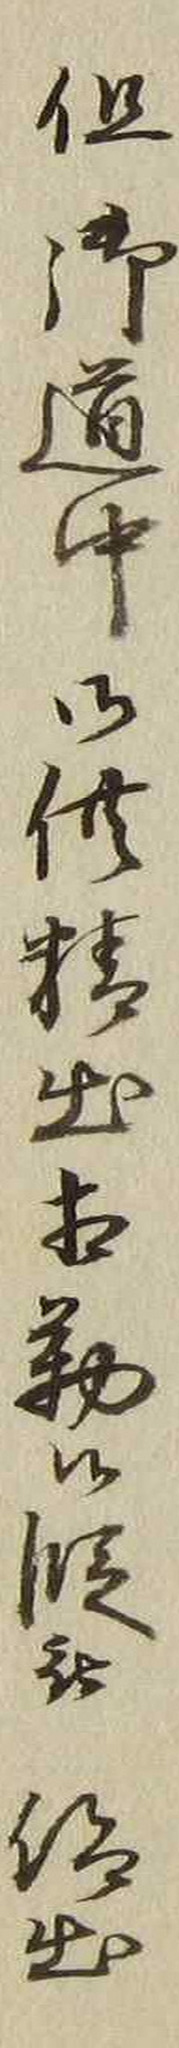但御道中御供精出相勤候段被仰出
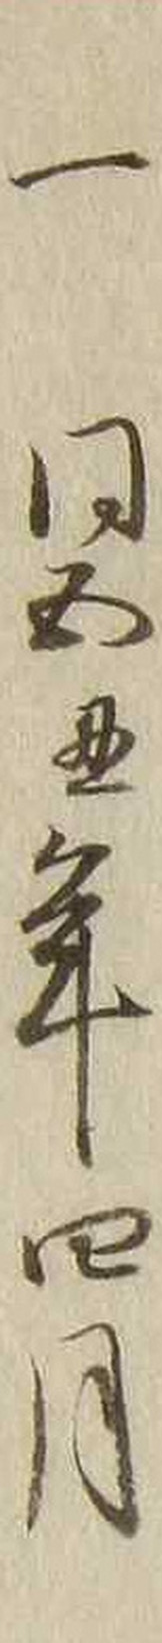一同五丑年四月
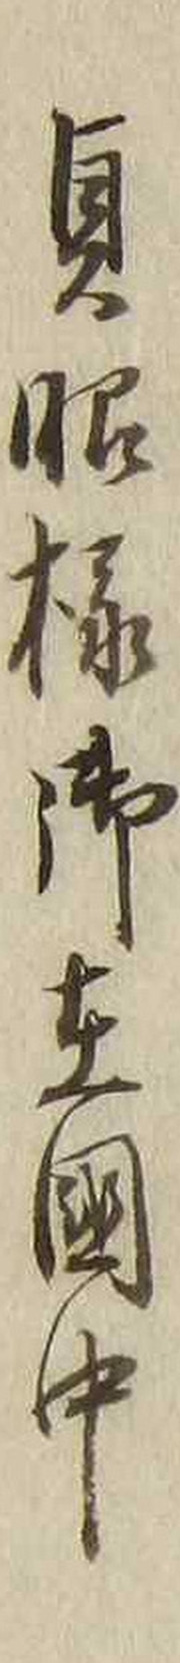貞昭様御在国中

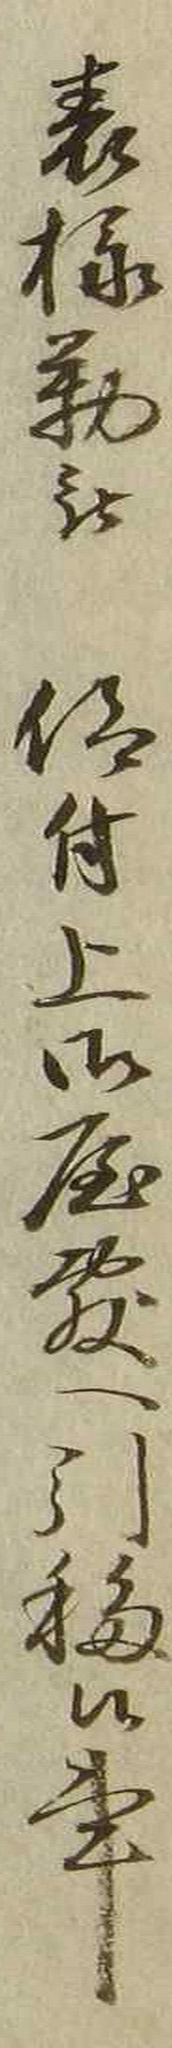表様勤被仰付上御屋敷ヘ引移候事
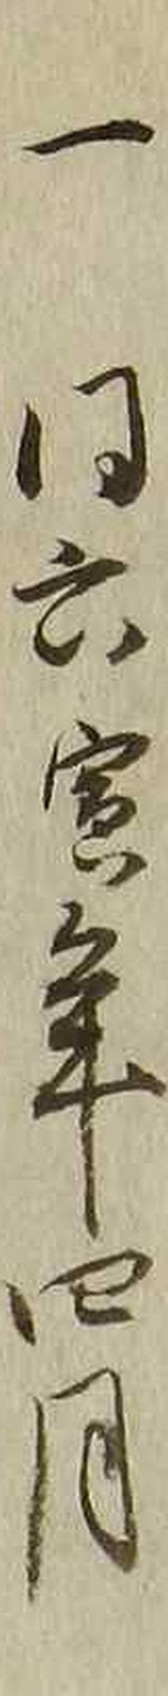一同六寅年四月
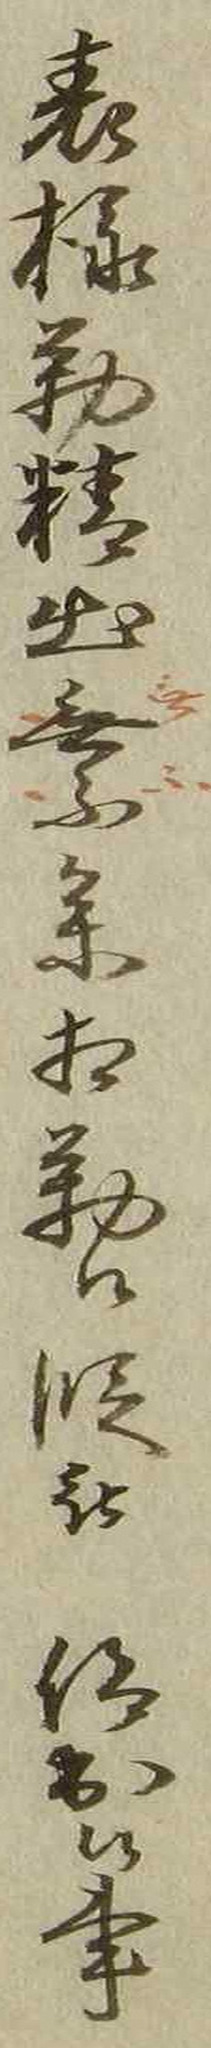表様勤精出無ふ参相勤候段被仰出候事
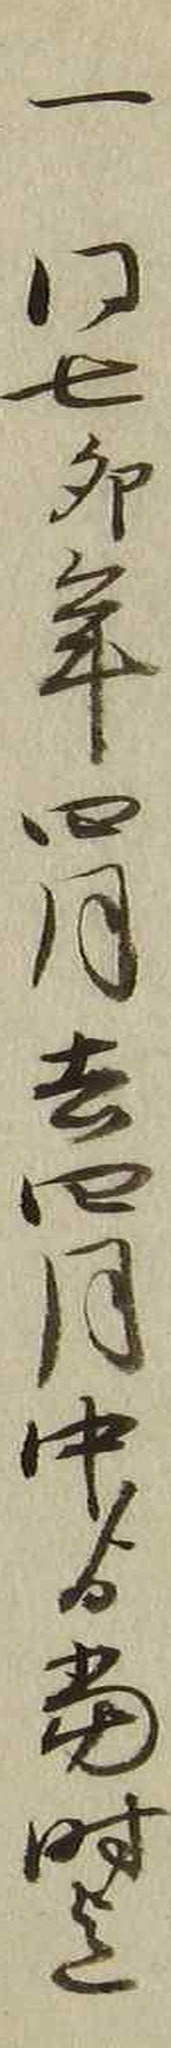一同七夘年四月去四月中ゟ当時迄
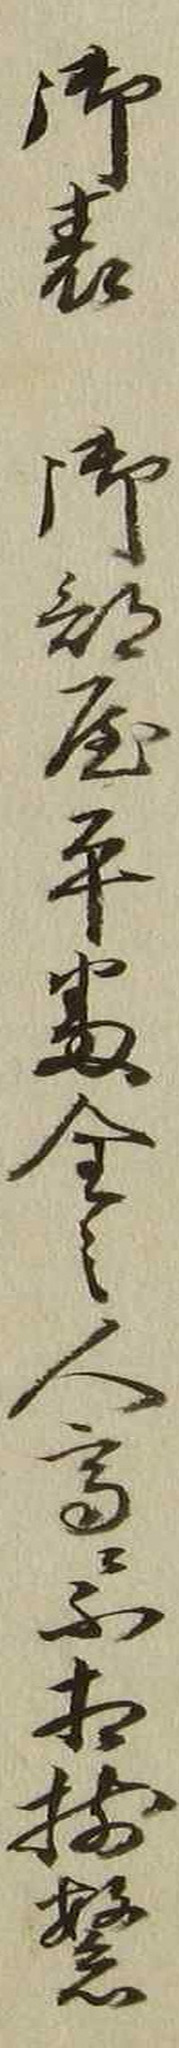御表御部屋平番全之人馬ニふ相揃繁
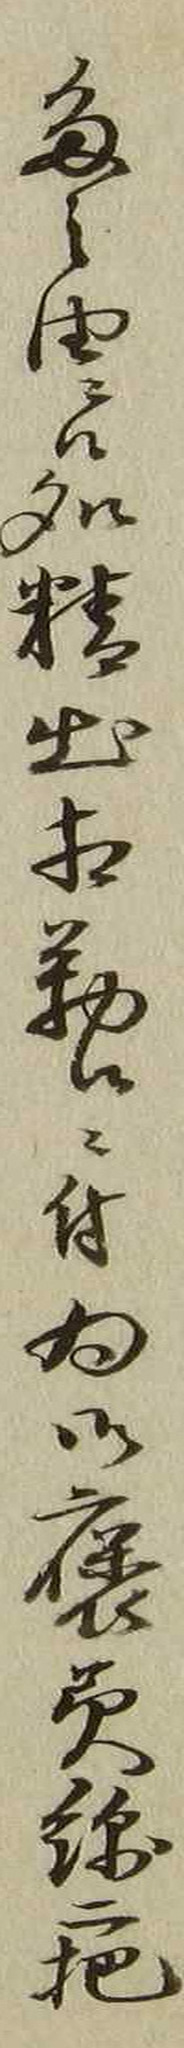多之由ニ候処精出相勤候ニ付ゐ御褒美綿二把
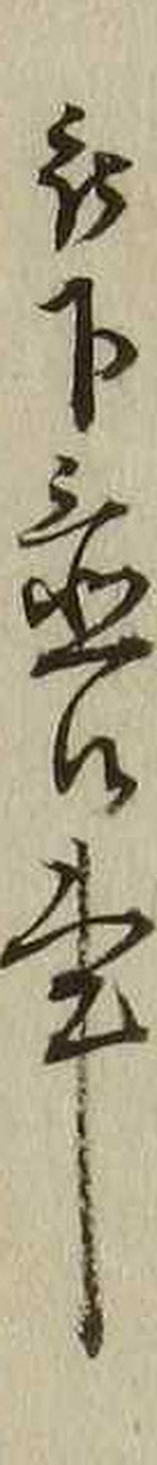被下置候事
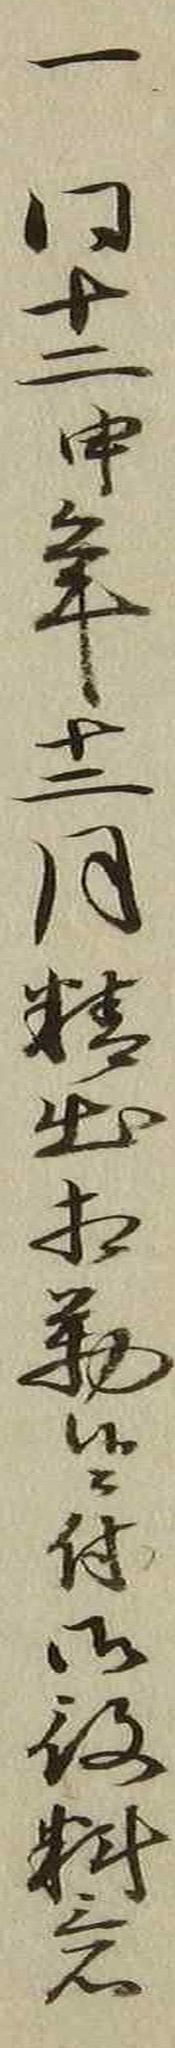一同十二申年十二月精出相勤候ニ付御役料三石
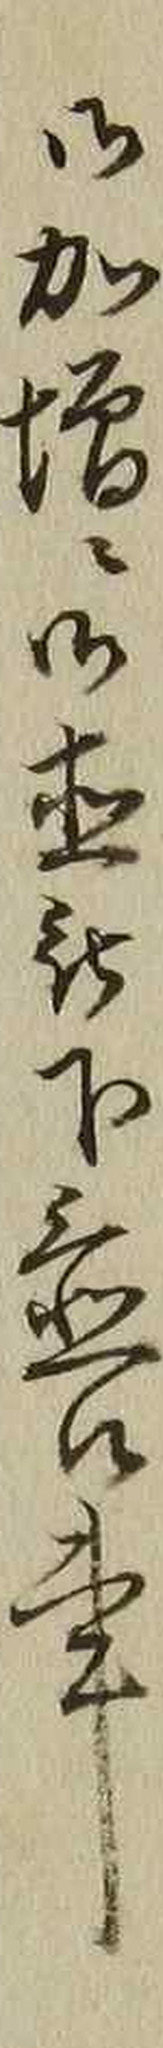御加増二御直被下置候事
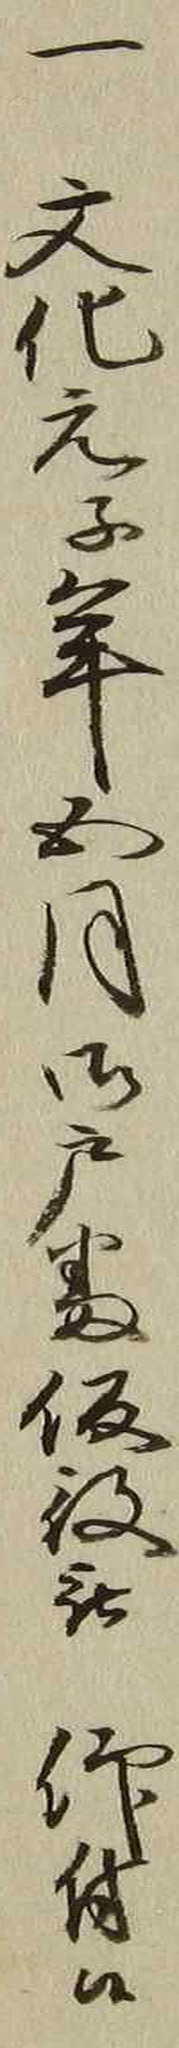一文化元子年五月御戸番仮役被仰付候
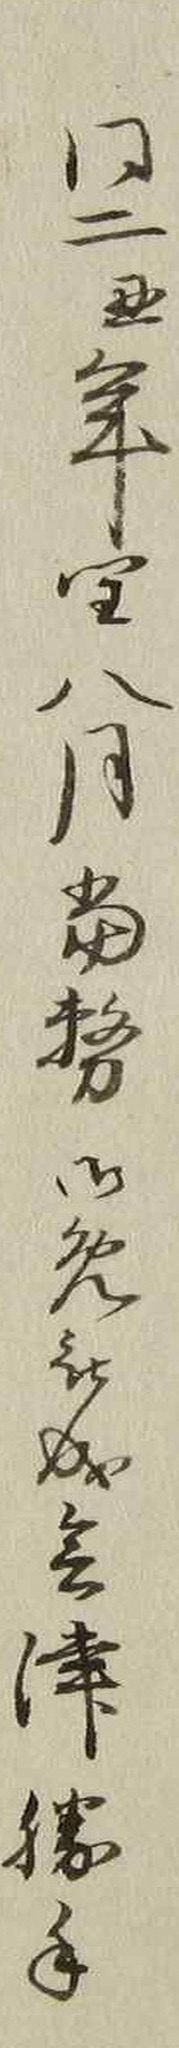一同ニ丑年閏八月当務御免被成会津勝手
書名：諸士系譜　巻之114　か之部22
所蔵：会津若松市立会津図書館
